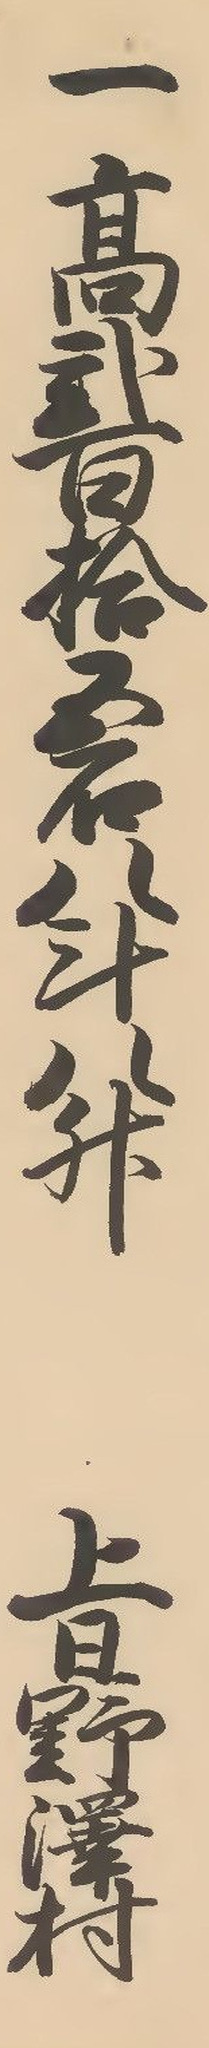一高弐百拾五石八斗八升上日野澤村
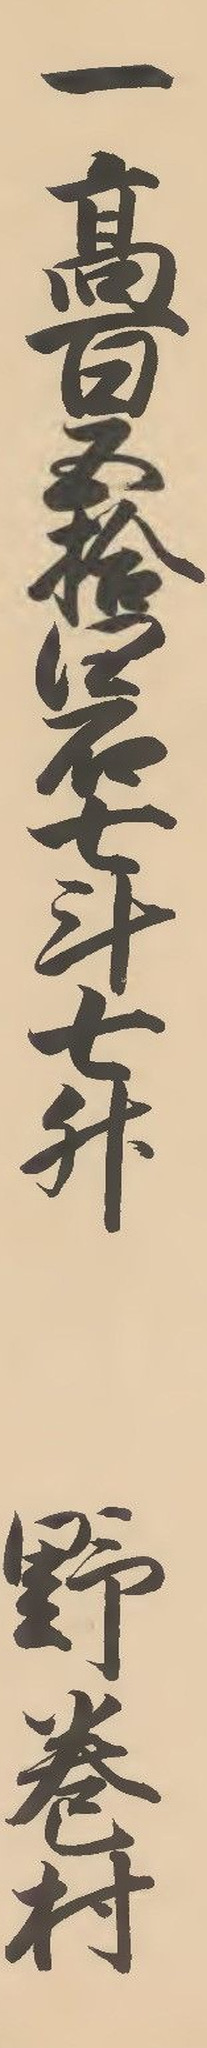一高百五拾四石七斗七升野巻村
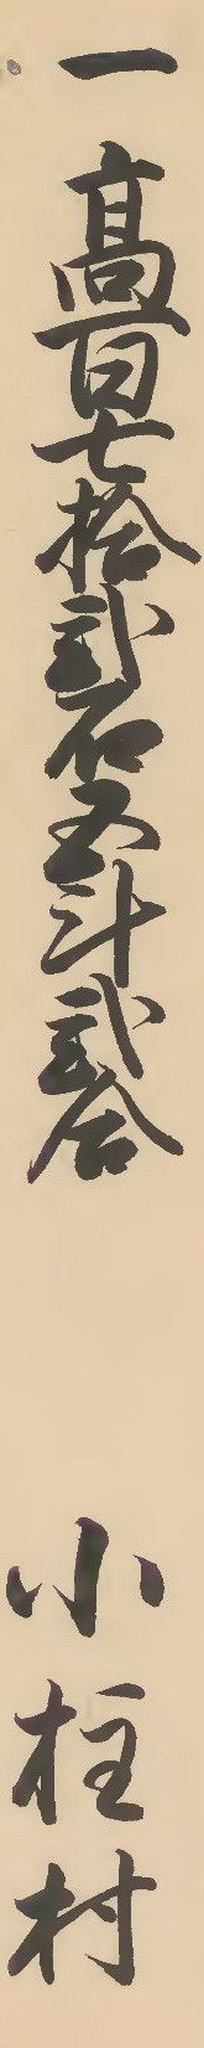一高百七拾弐石五斗弐合小柱村

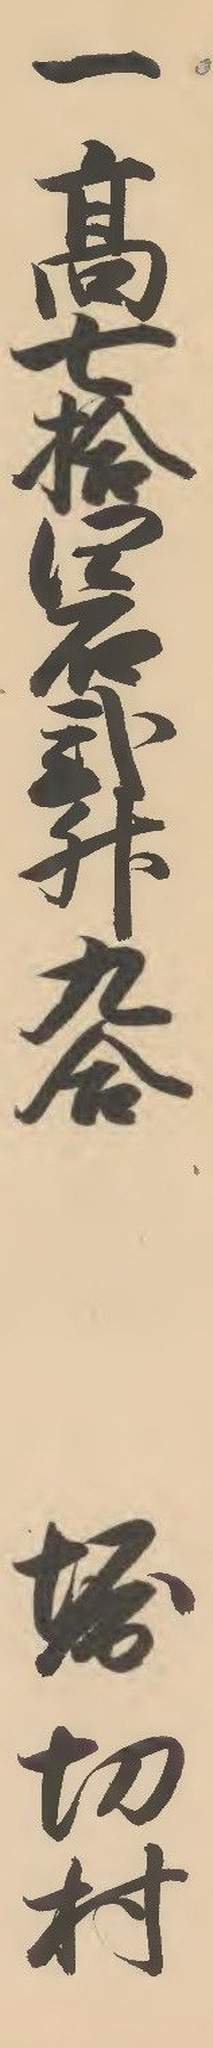一高七拾四石弐升九合堀切村
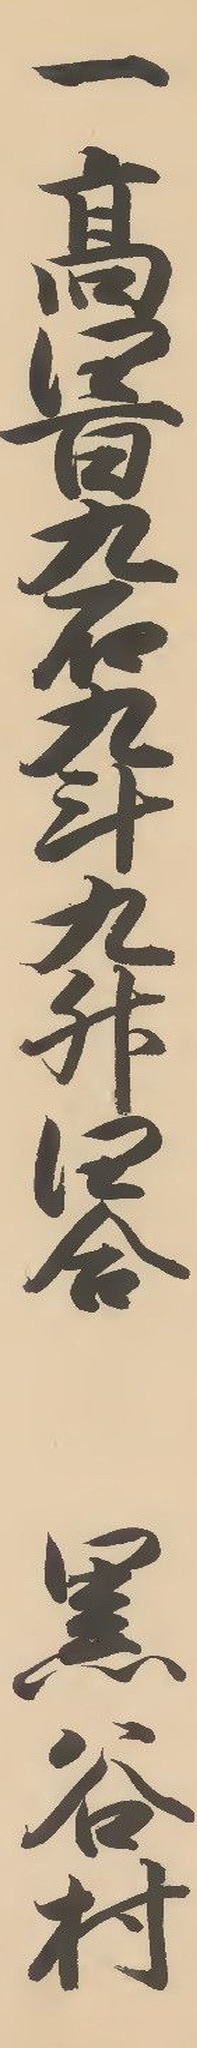一高四百九石九斗九升四合黒谷村
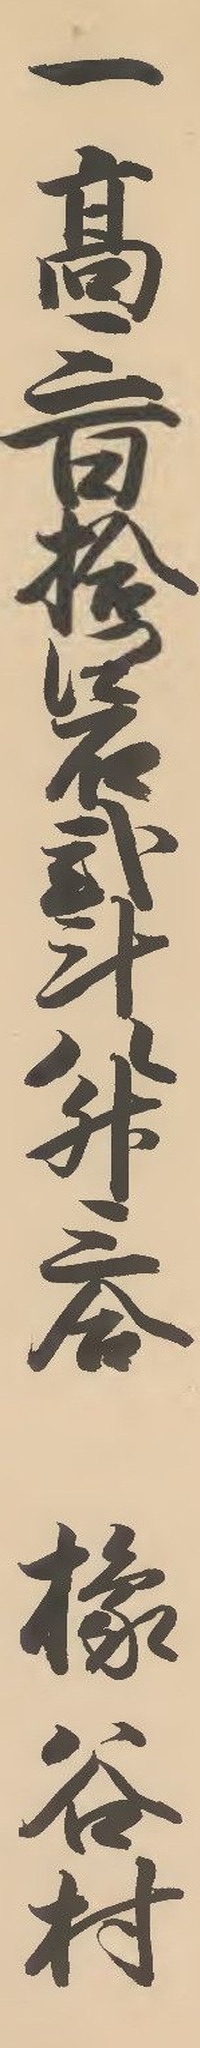一高三百拾四石弐斗八升三合橡谷村
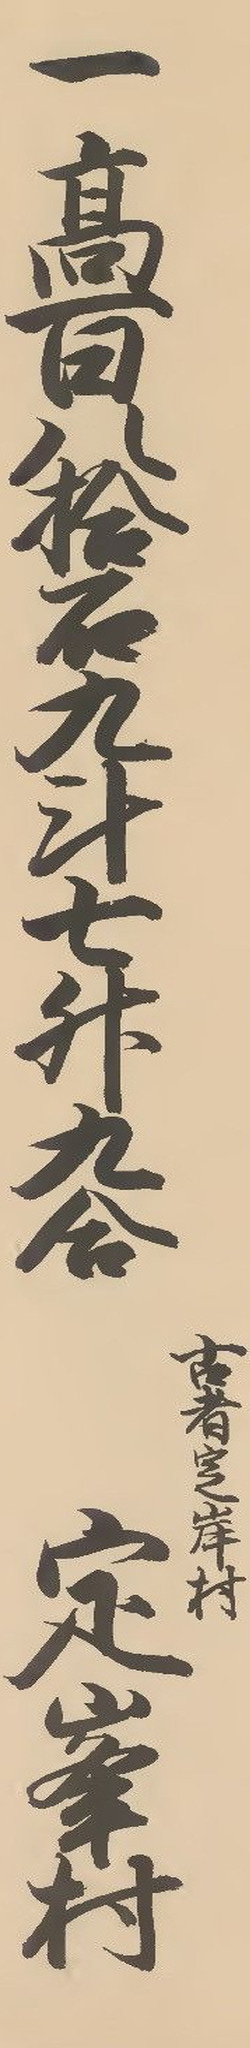一高百八拾石九斗七升九合定峯村
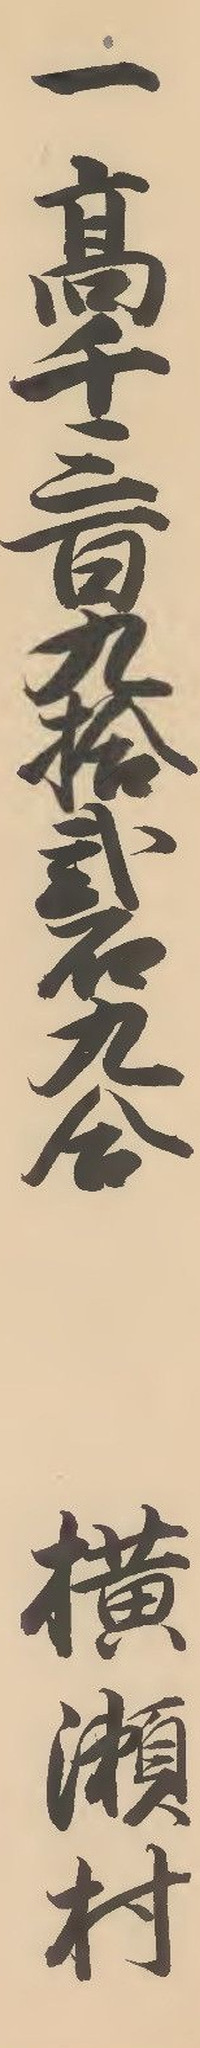一高千三百九拾弐石九合横瀬村
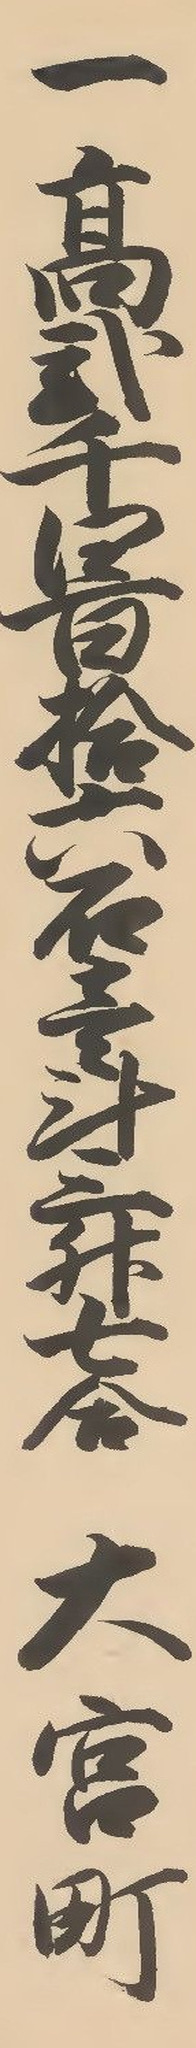一高弐千四拾六石壱斗三升七合大宮町
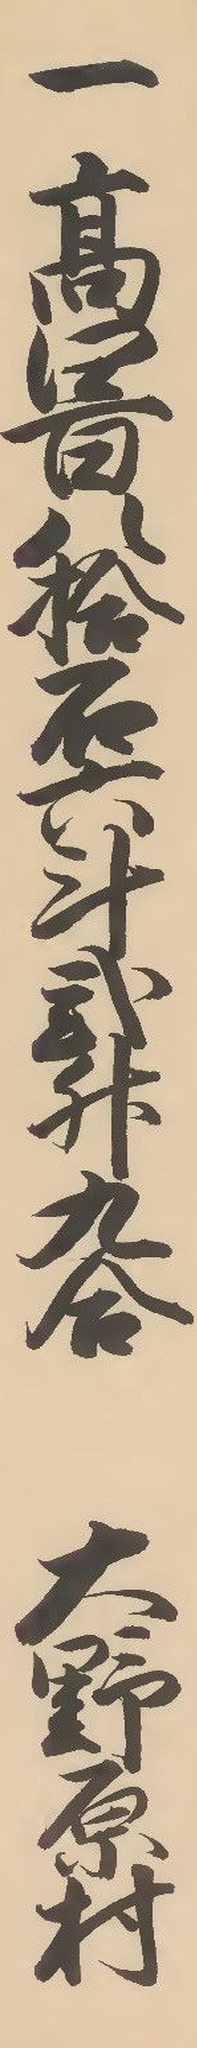一高四百八拾石六斗弐升九合大野原村

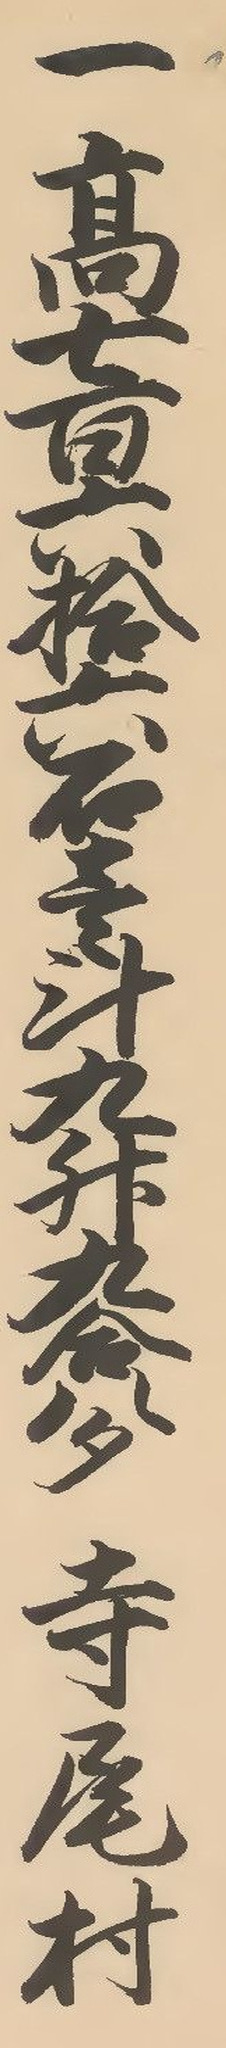一高七百六拾六石壱斗九升九合八勺寺尾村
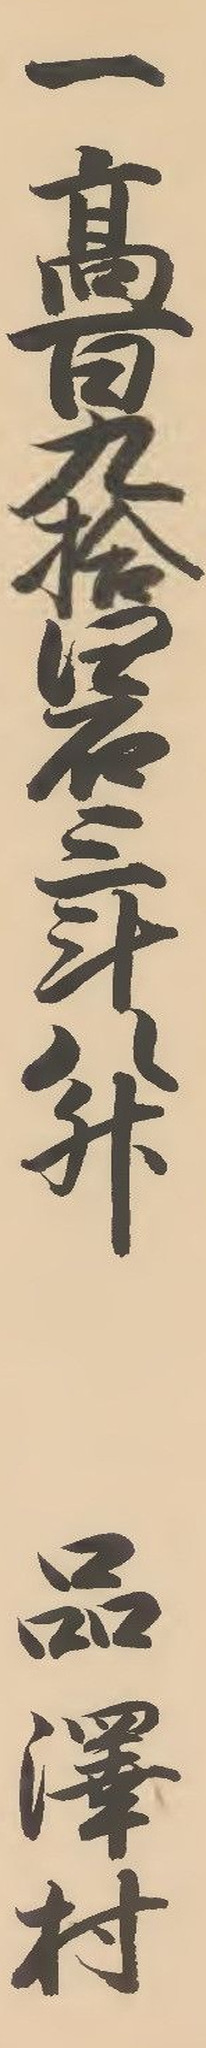一高百九拾四石三斗八升品澤村
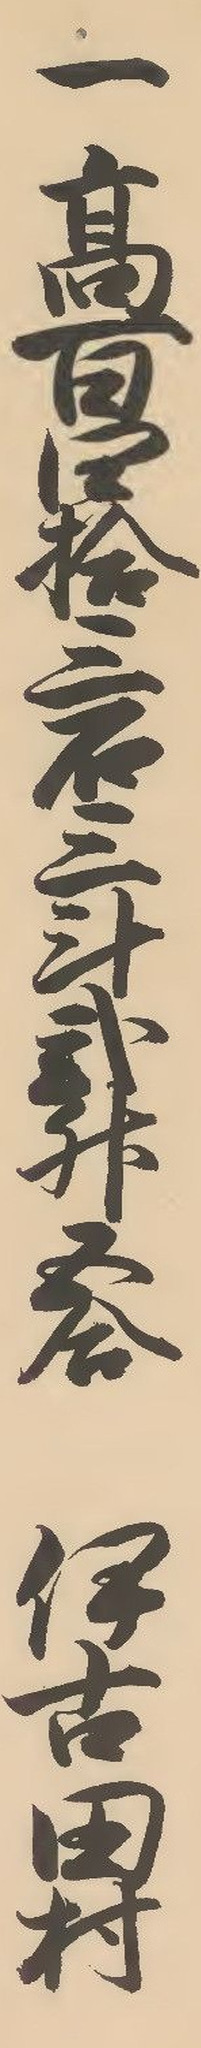一高百四拾三石三斗弐升五合伊古田村
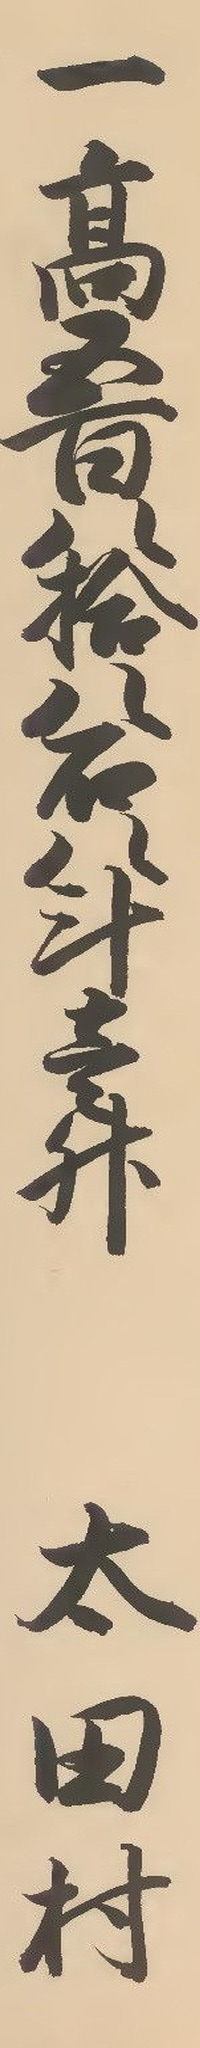一高五百八拾八石八斗壱升太田村
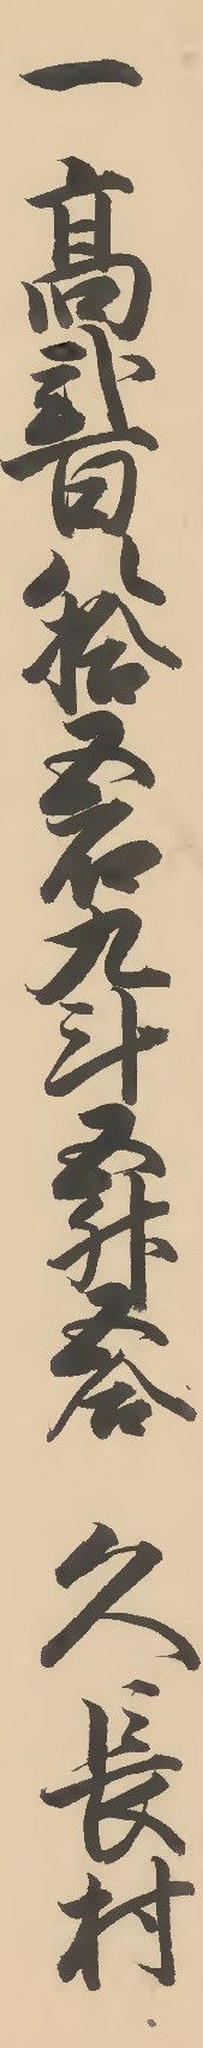一高弐百八拾五石九斗五升五合久長村
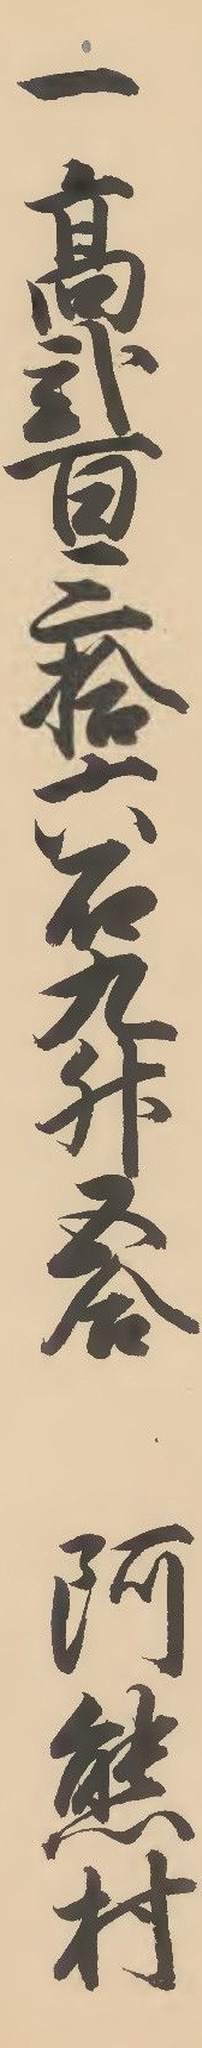一高弐百三拾六石九升五合阿熊村
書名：武蔵国郷帳　上
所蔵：国立公文書館 National Archives of Japan
